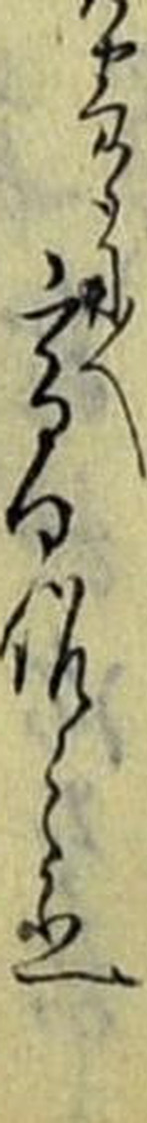髙田作之丞
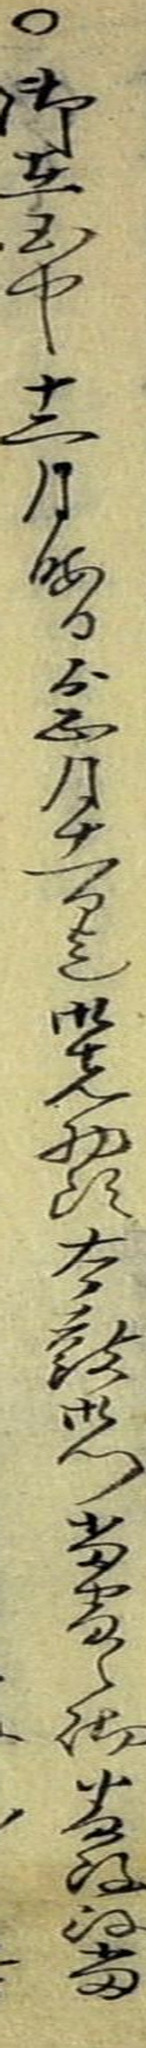○御在国中十二月晦日ゟ正月十一日迄御先物頭太鼓御門当番之砌番改役当
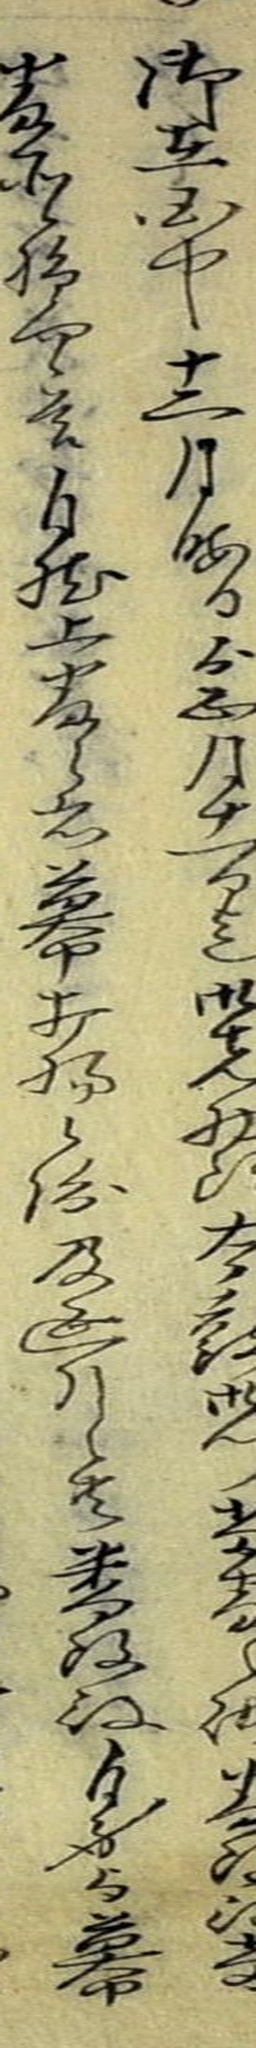番所へ指向候節自然上番之者幕打揚候儀及延引候共番改役自身と幕
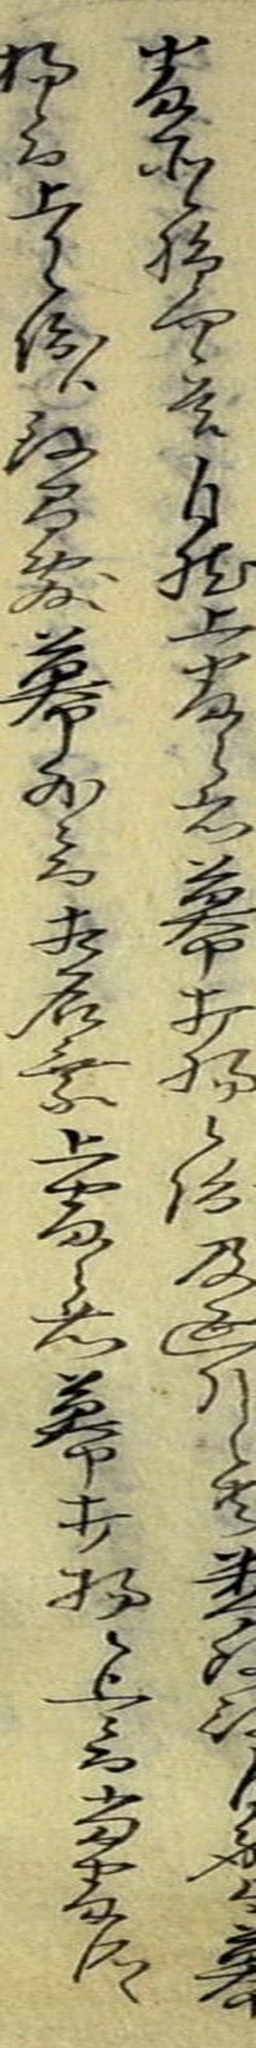揚候而上り候儀は致間敷幕外弐｣而相名乗上番之者幕打揚候上に而当番処へ
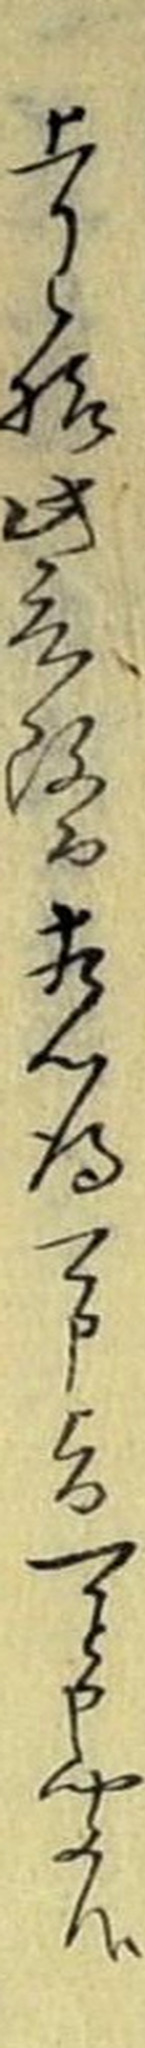上り候様此度改而相心得可申旨可被申聞候
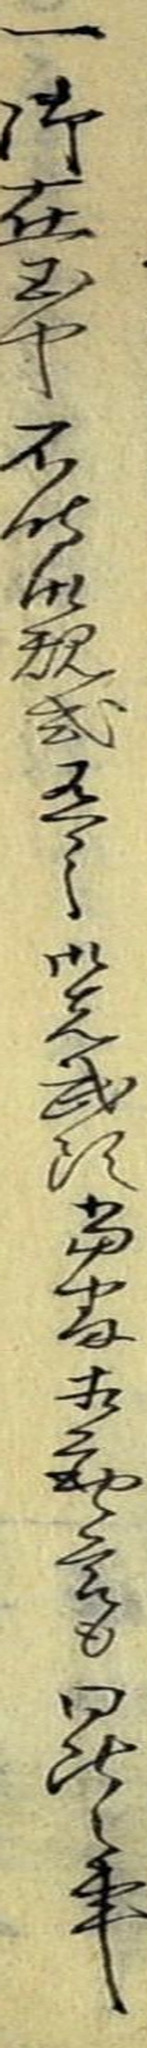一御在国中不時御規式有之御先武頭当番相勤候節も同断之事
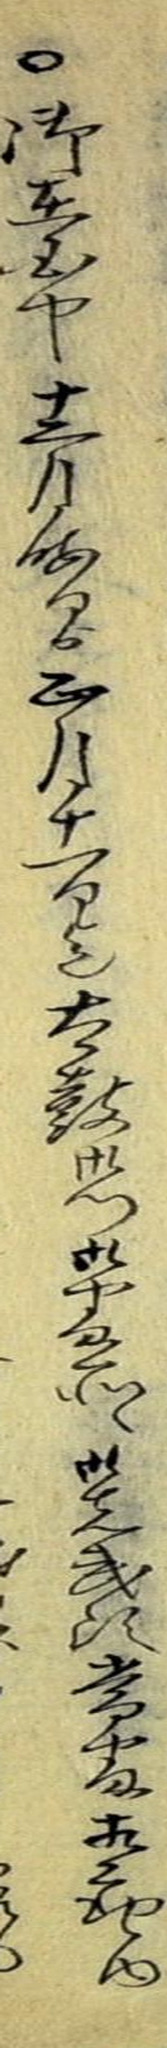○御在国中十二月晦日ゟ正月十一日迄太鼓御門御番所へ御先武頭当番相勤候内
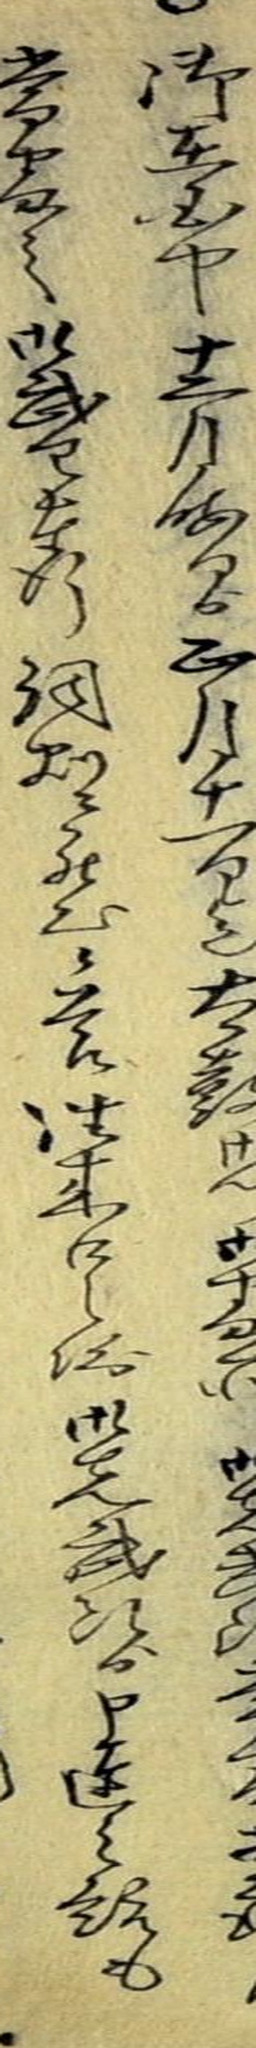当番之御武具奉行調判に罷出候節往来口之儀御先武頭ゟ申達候趣も
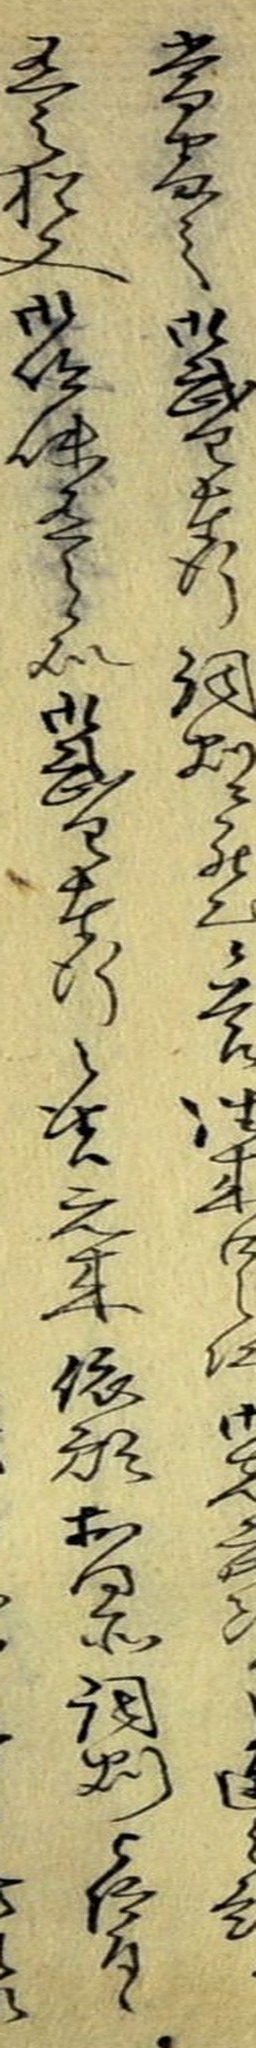有之猶又御吟味有之候処御武具奉行之儀は元来依願於同所調判被仰付候
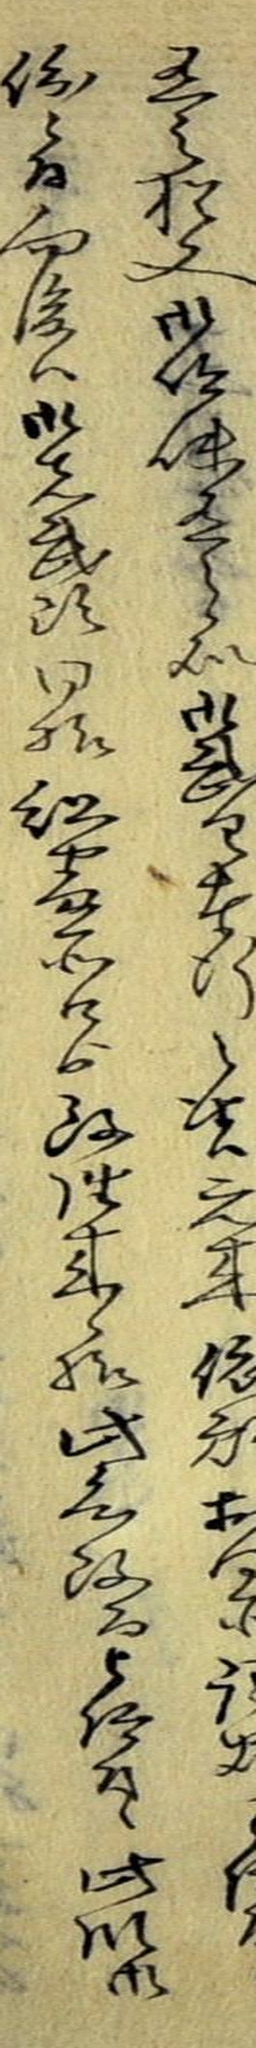儀に付向後は御先武頭同様組番所口ゟ致往来候様此度改而被仰付候此段御
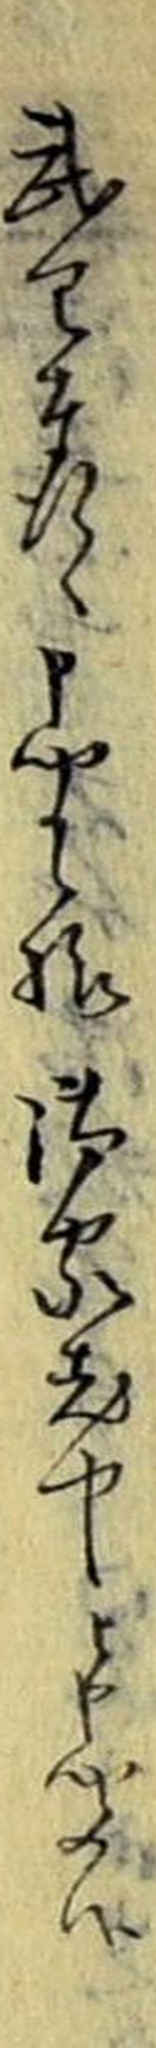武具奉行へ申聞候様御家老中被申聞候

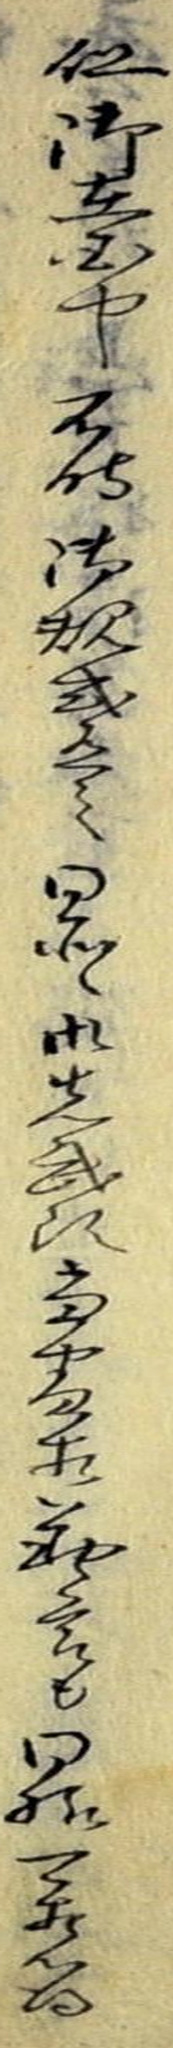但御在国中不時御規式有之同所へ御先武頭当番相勤候節も同様可相心得
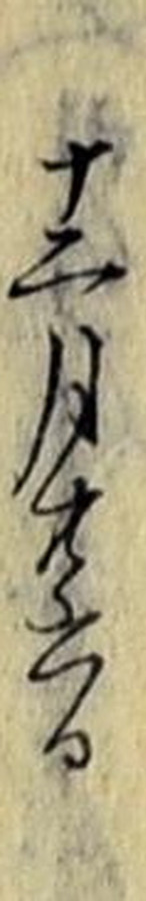十二月廿六日
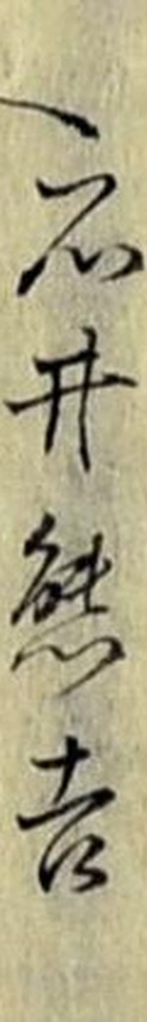石井熊吉
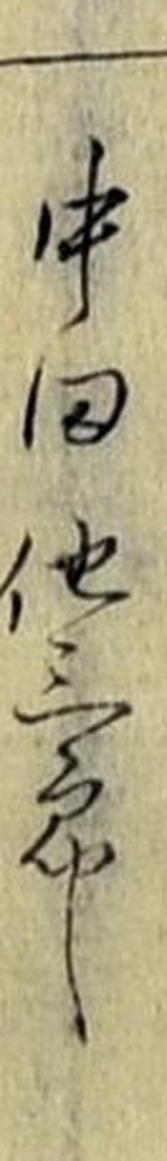中田他三郎
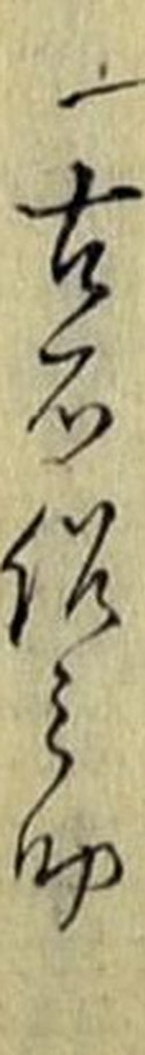古石作之助
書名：命令之部 六
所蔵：福井県文書館 Fukui Prefectural Archives
